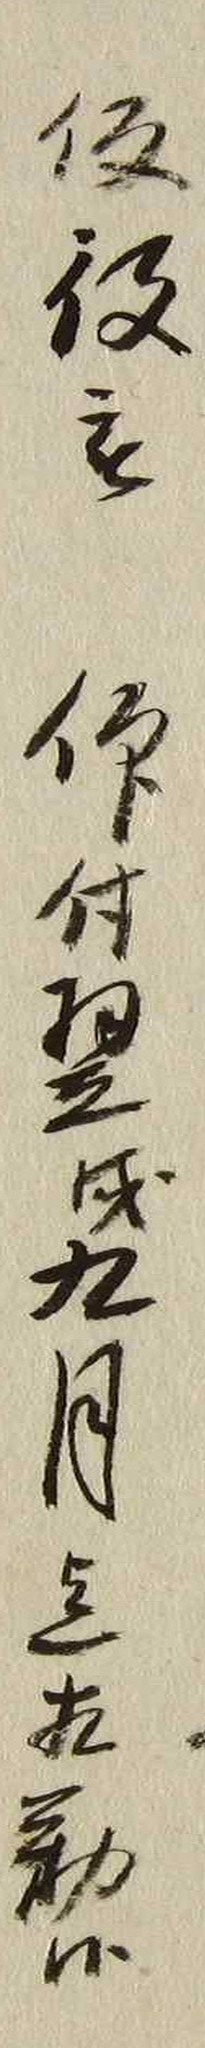仮役被仰付翌戌九月迄相勤候
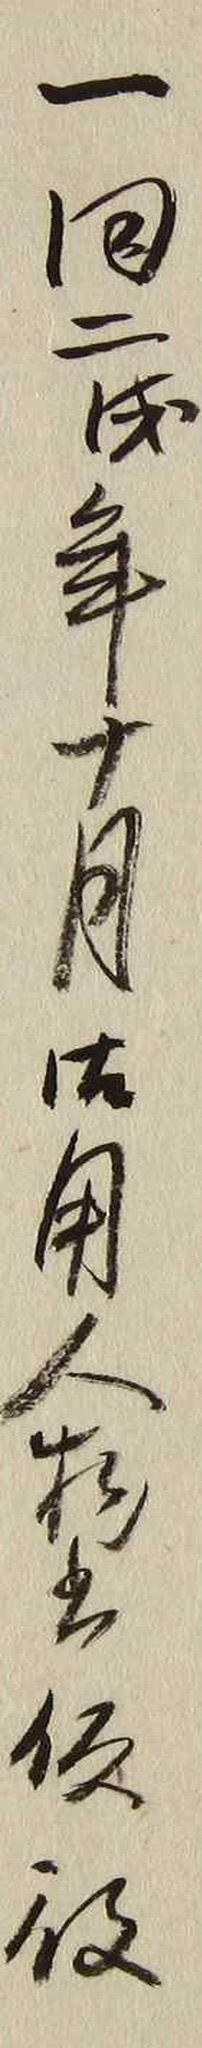一同二戌年十月御用人物書仮役
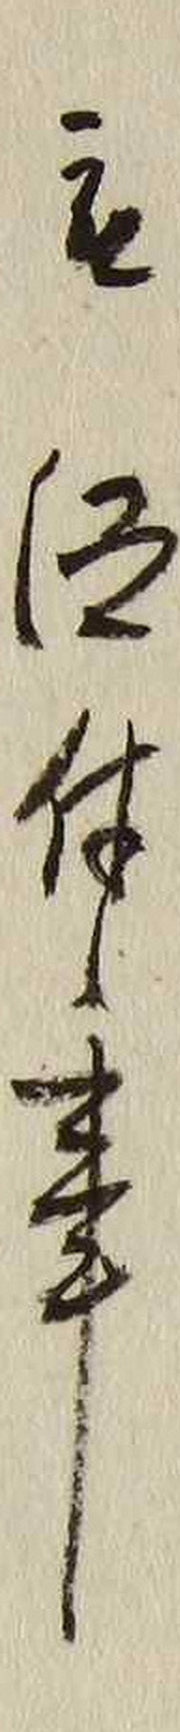被仰付候事
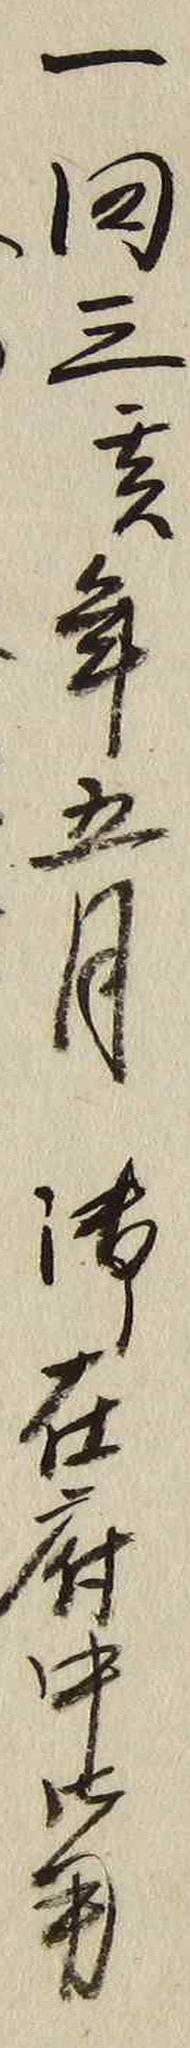一同三亥年五月御在府中御用
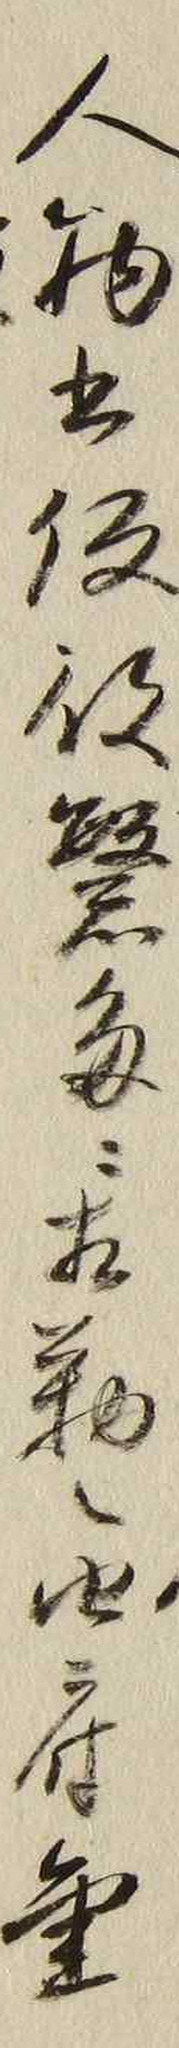人物書仮役繁多ニ相勤候由ニ付金
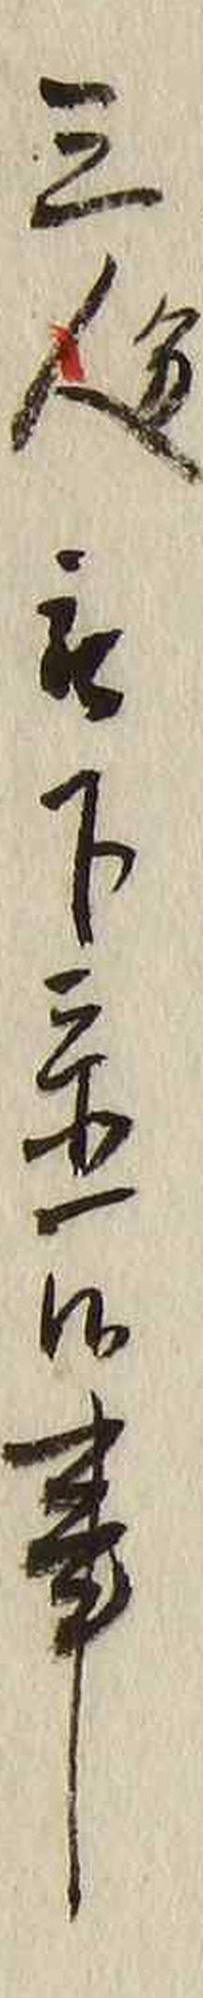三両被下置候事

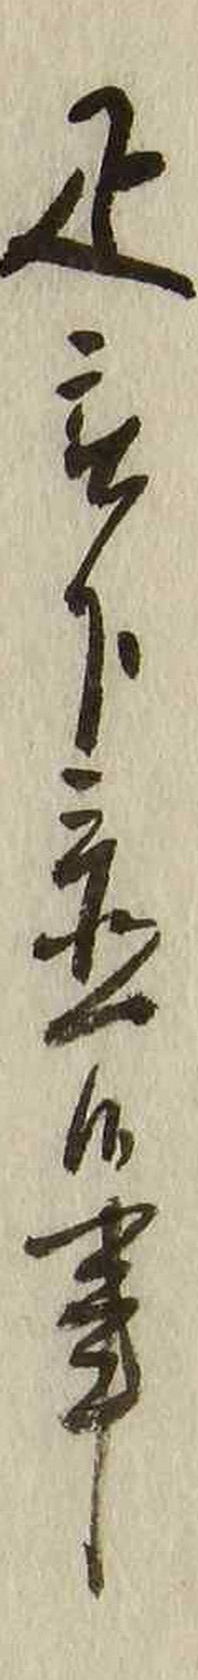疋被下置候事
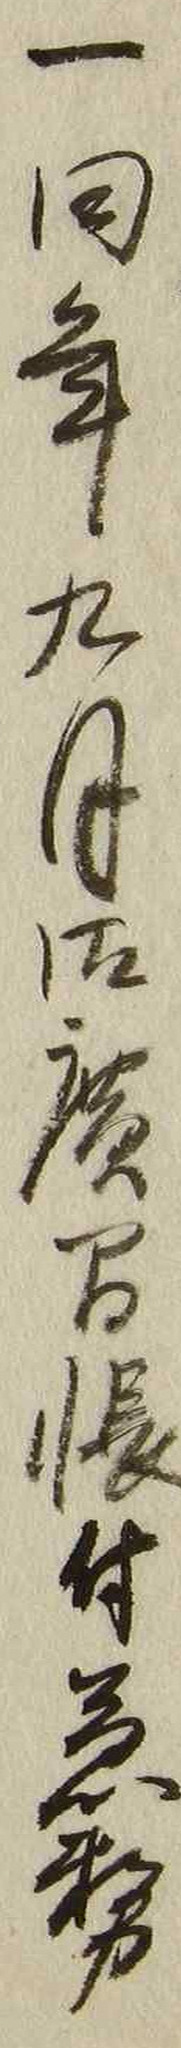一同年九月御広間帳付兼務
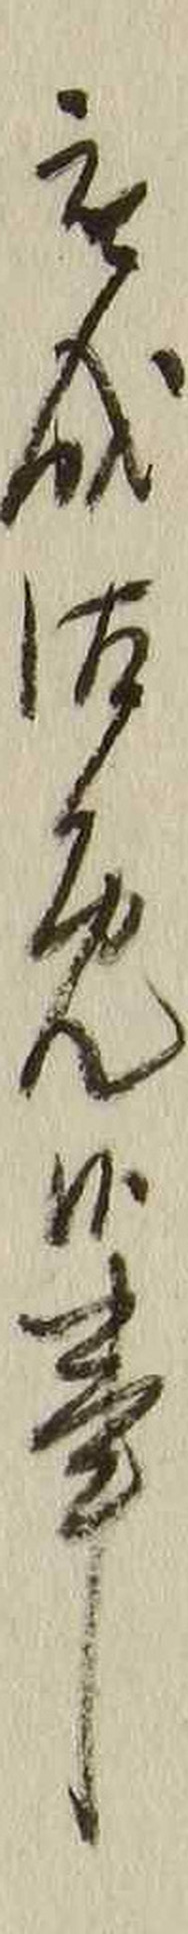被成御免候事
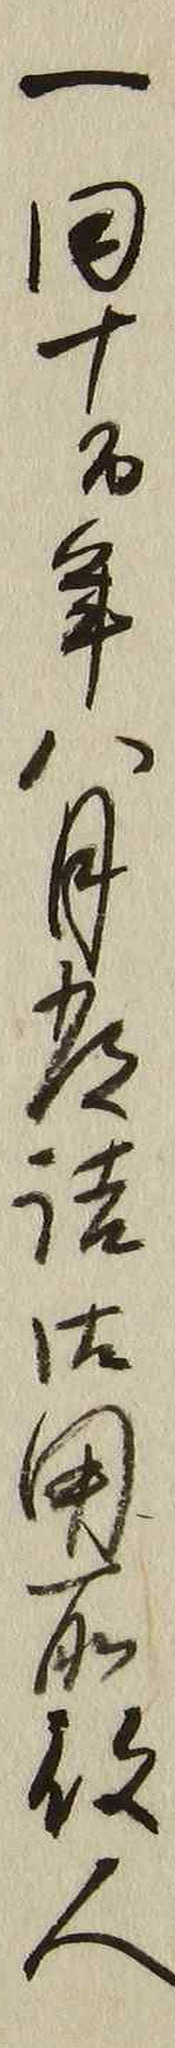一同十酉年八月常詰御用所役人
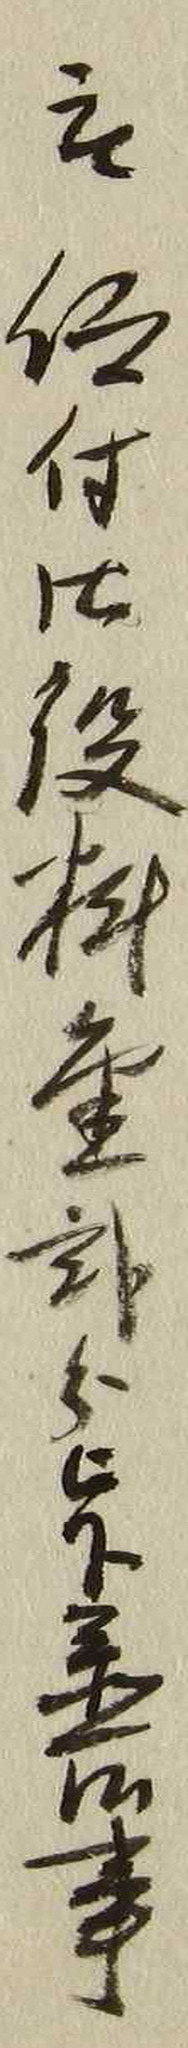被仰付御役料金弐分被下置候事
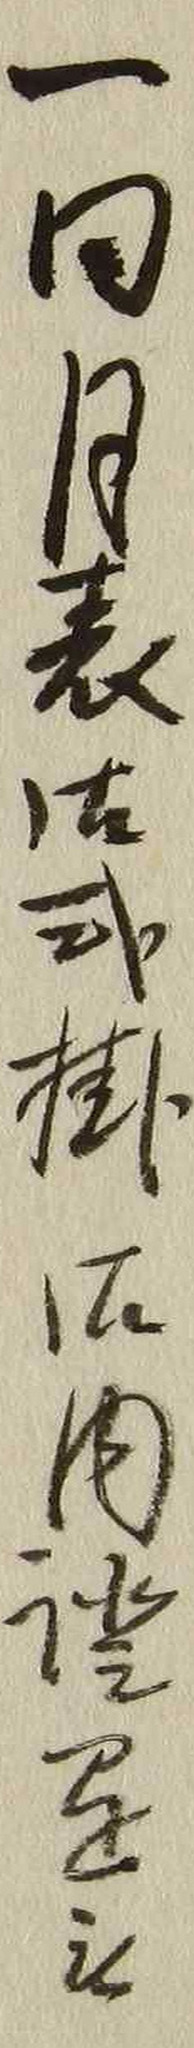一同月表御式掛御内証懸被
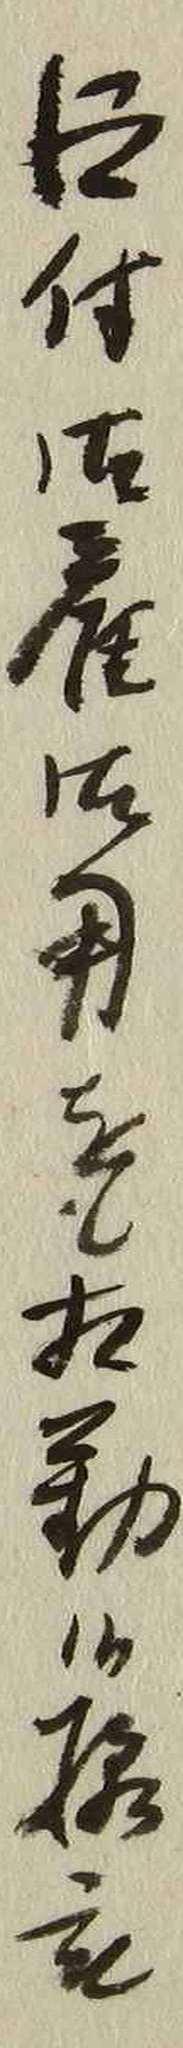仰付御雇御用をも相勤候様被
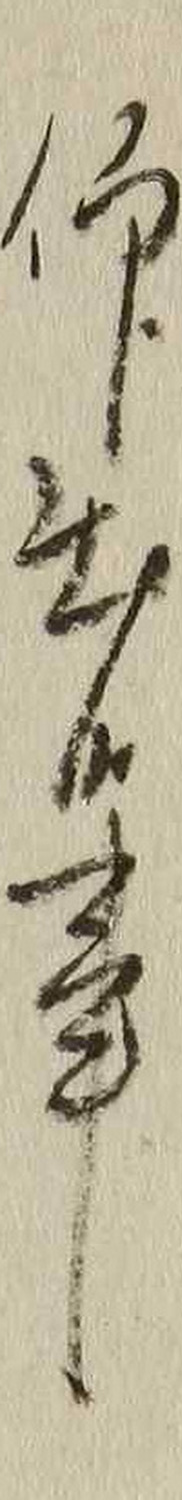仰出候事
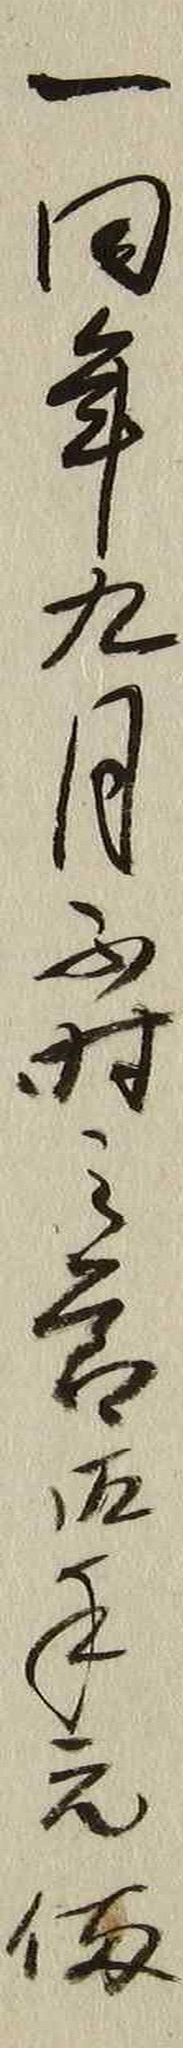一同年九月不時之節御手元備
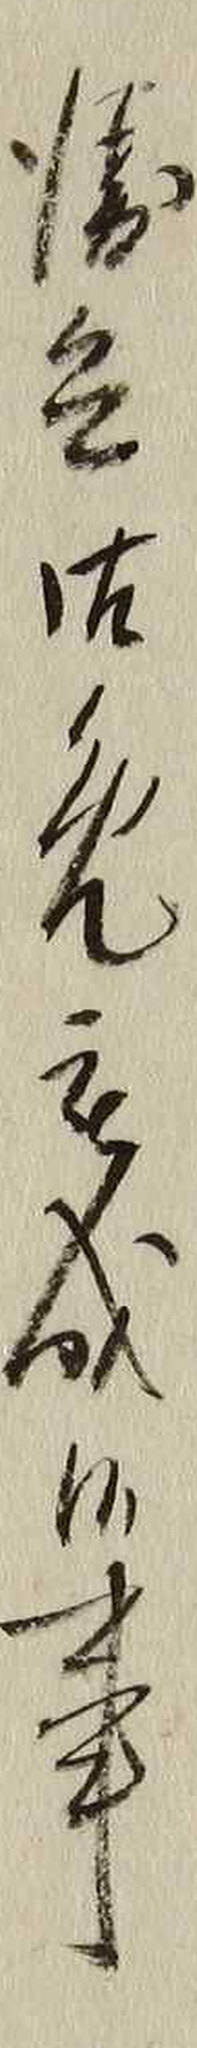衛兵御免被成候事
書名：諸士系譜　巻之353　す之部3
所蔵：会津若松市立会津図書館
